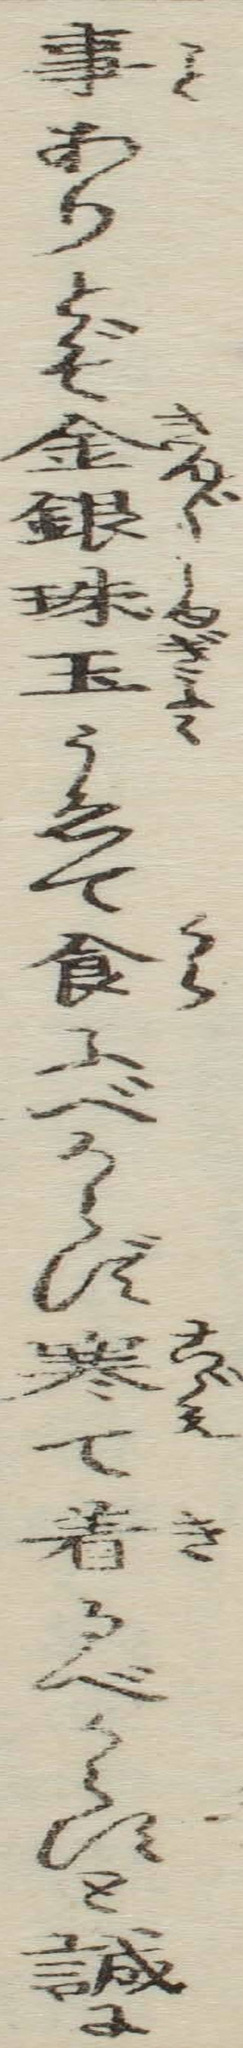事ありとぞ金銀珠玉うゑて食ふべからず寒て着るべからすと誠に

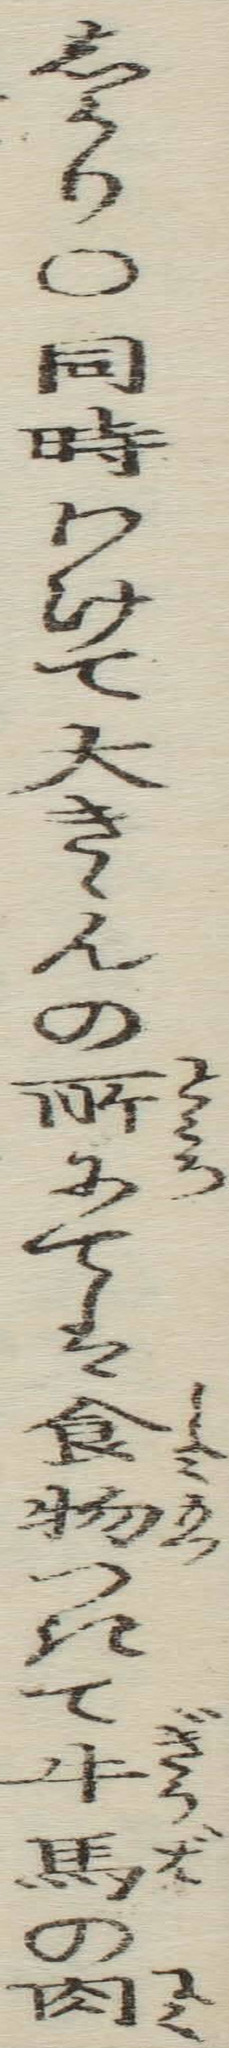しかり○同時わけて大きゝんの所にては食物つきて牛馬の肉
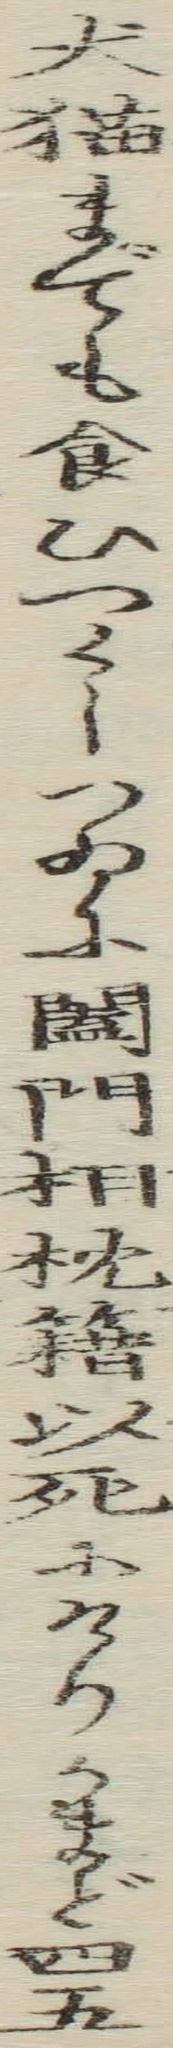犬猫までも食ひつくしつゐに闔門相枕籍以死にけりかまど四五
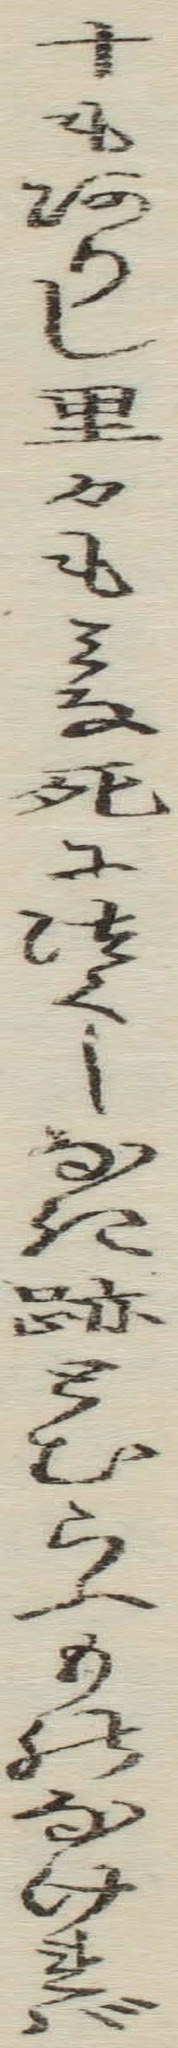十もありし里々もみな死につくしなき跡とむらふものなければ
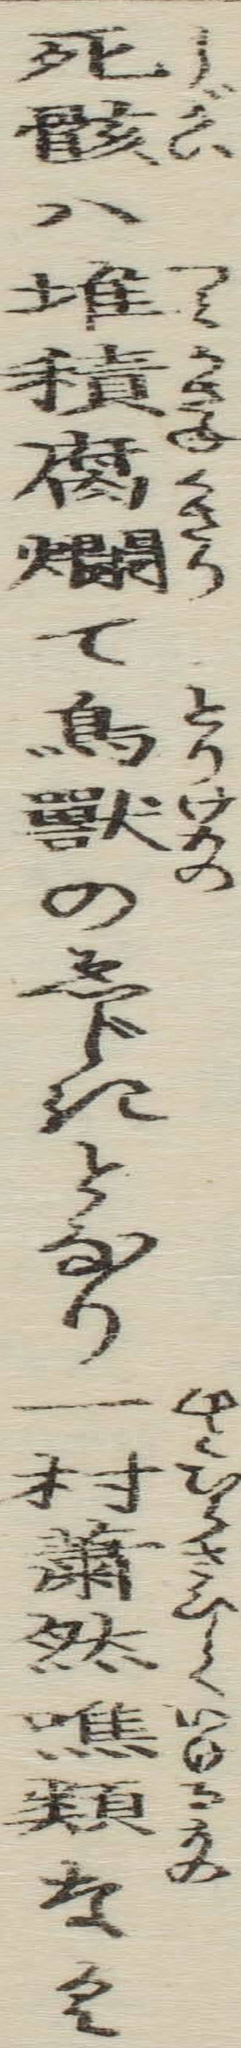死骸は堆積腐爛て鳥獣のゑじきとなり一村粛然噍類なく
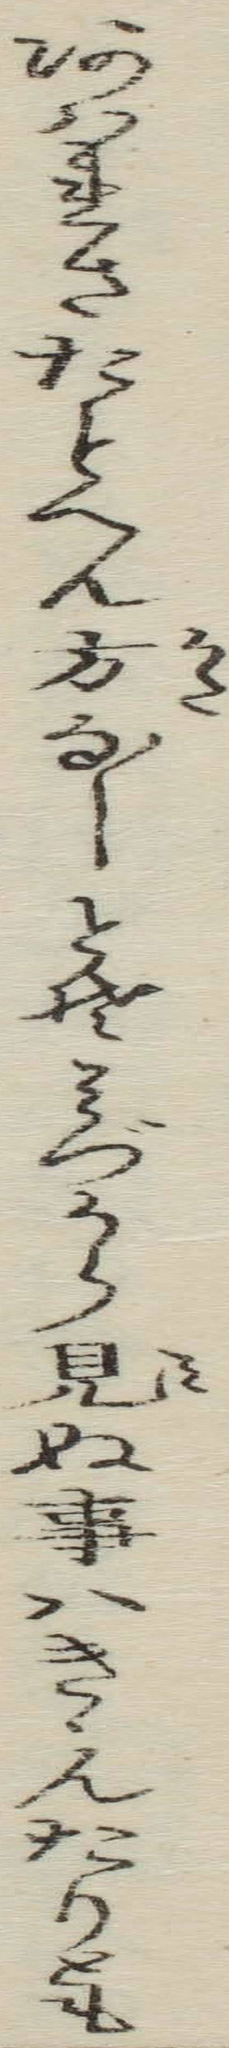あはれさたとへん方なしとそみづから見ぬ事はきゝんたりとも
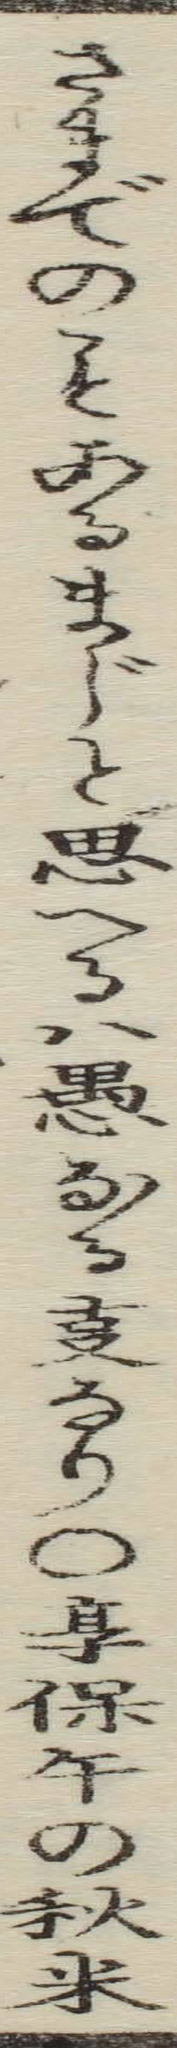さまでのことあるまじと思へるは愚なる事なり○享保午の秋米
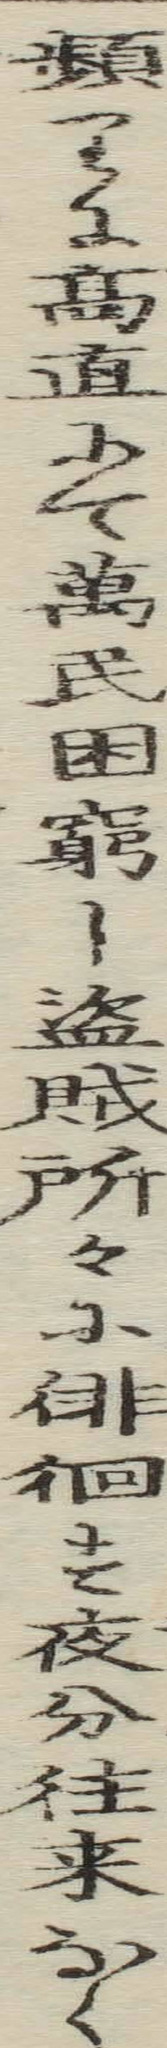頻りに高直にて万民困窮し盗賊所々に徘徊す夜分往来なく
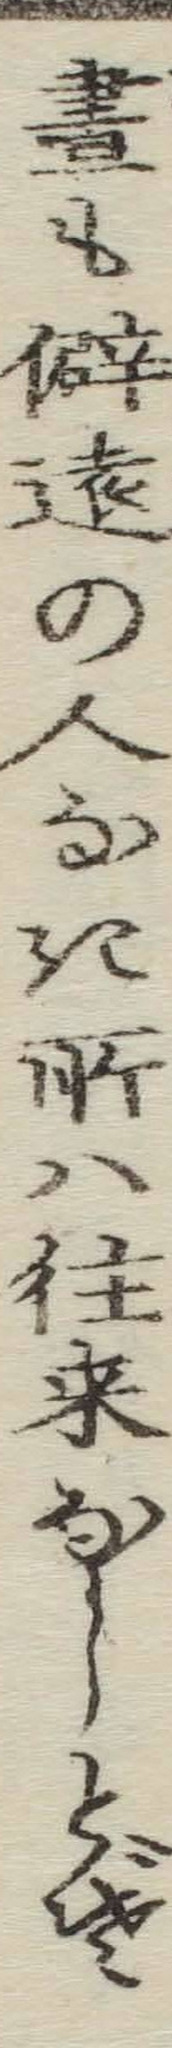昼も僻遠の人なき所は往来なしとぞ
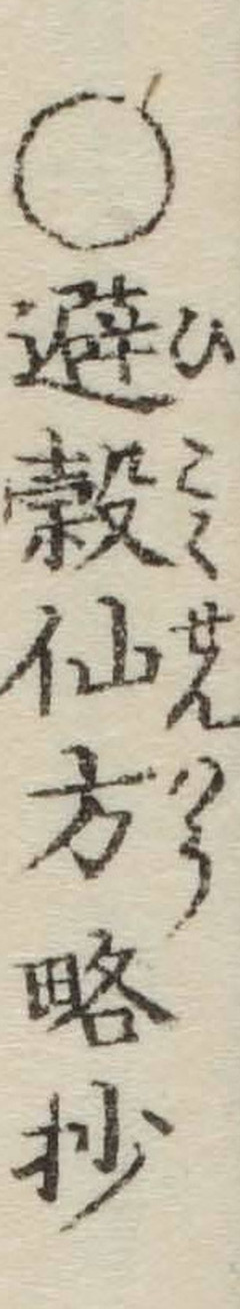○避穀仙方略抄
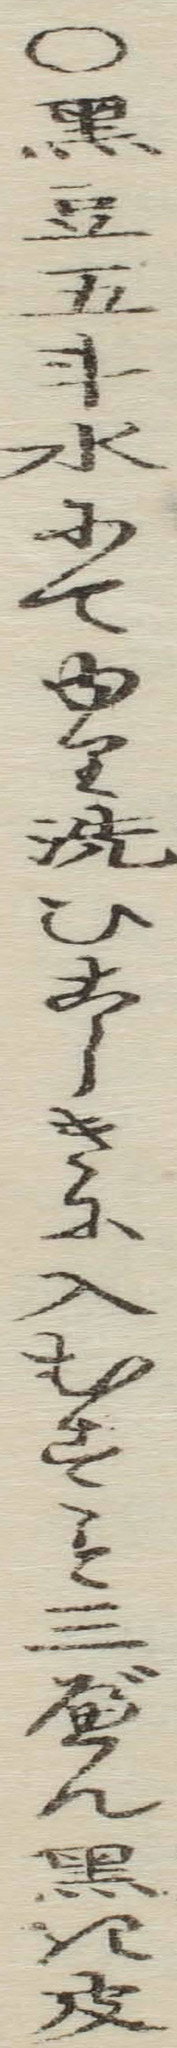○黒豆五斗水にてゆり洗ひこしきに入むすこと三べん黒き皮
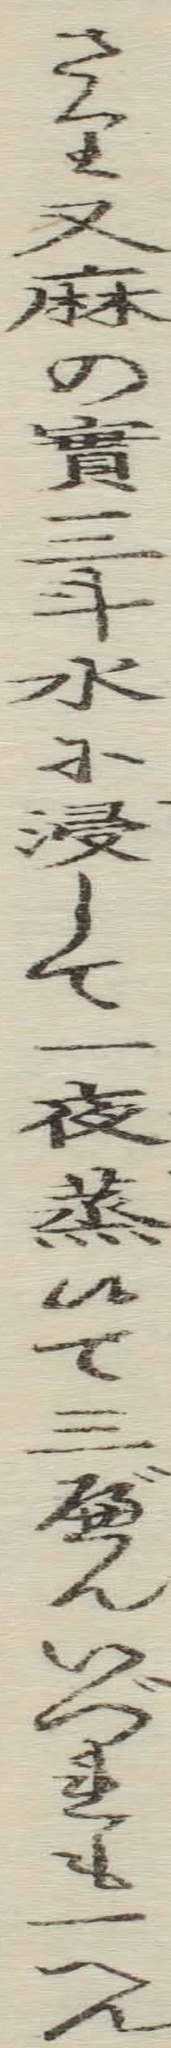さり又麻の實三斗水に浸して一夜蒸候て三べんいづれも一へん
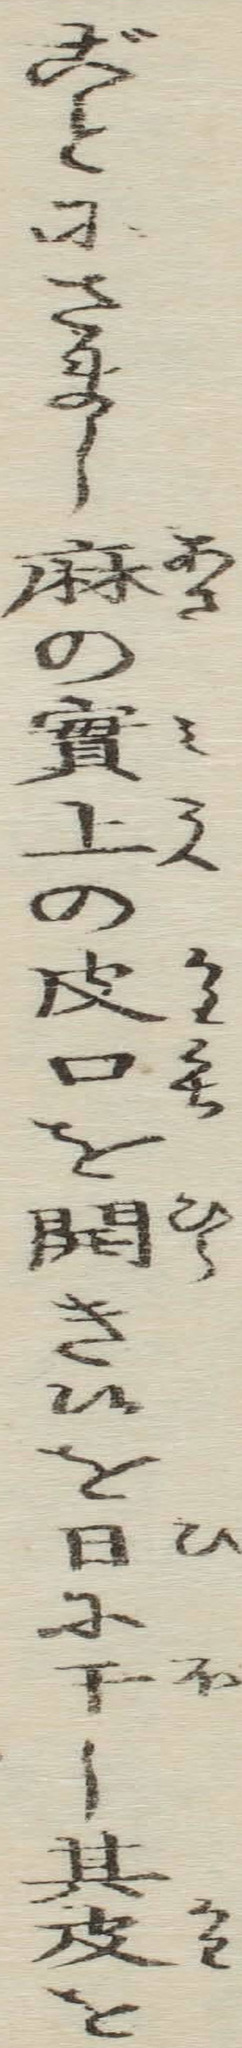ごとにさまし麻の實上の皮口を開き候を日に干し其皮を
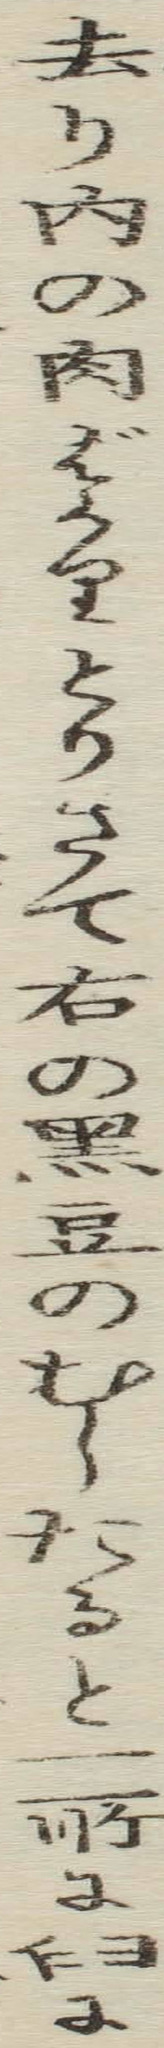去り内の肉ばかりとりさて右の黒豆のむしたると一所に臼に
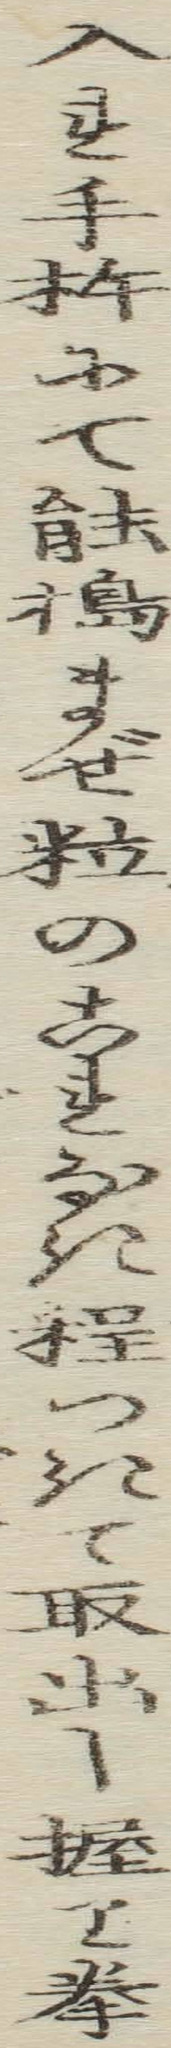入れ手杵にて能槝まぜ粒のこれなき程つきて取出し握り拳
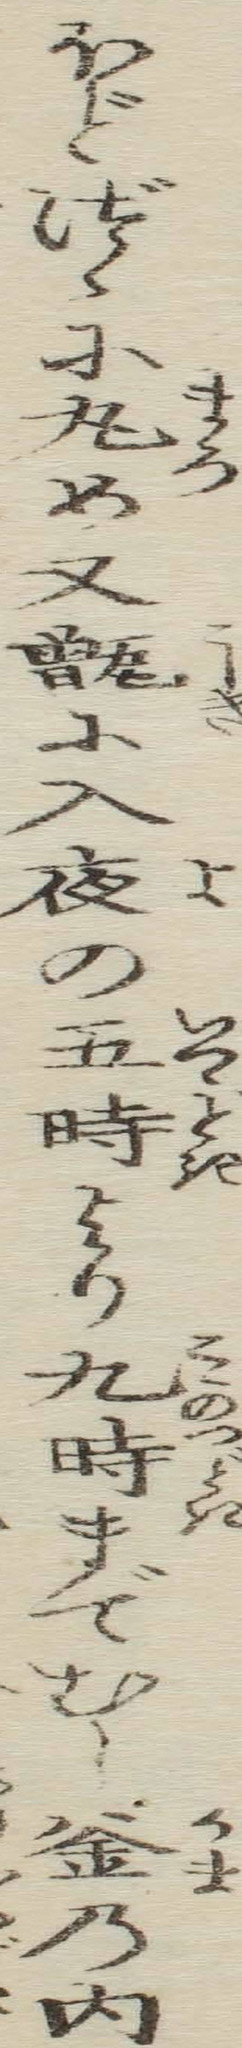ほどづゝに丸め又甑に入夜の五時より九時までむし釜の内
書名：救荒便覧
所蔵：国文学研究資料館
